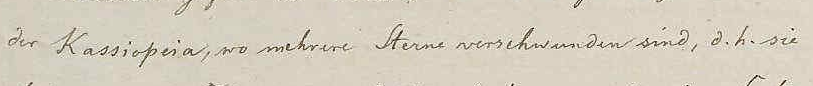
der Kassiopeia, wo mehrere Sterne verschwunden sind, d. h. sie
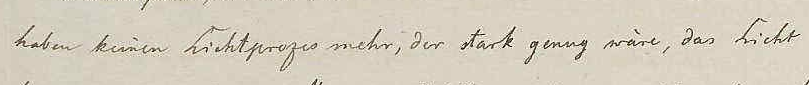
haben keinen Lichtprozes mehr, der stark genug wäre, das Licht
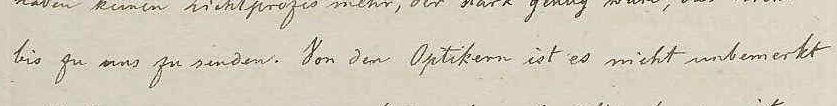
bis zu uns zu senden. Von den Optikern ist es nicht unbemerkt
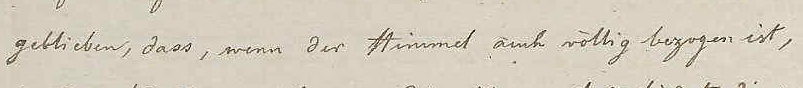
geblieben, dass, wenn der Himmel auch völlig bezogen ist,
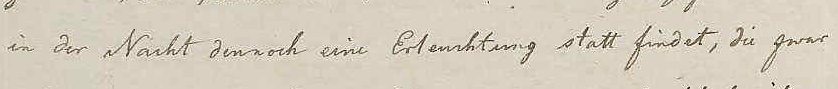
in der Nacht dennoch eine Erleuchtung statt findet, die zwar
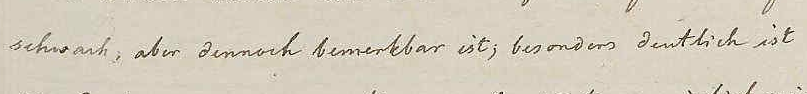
schwach, aber dennoch bemerkbar ist; besonders deutlich ist
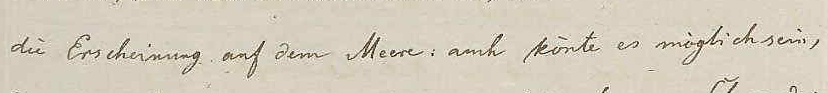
die Erscheinung auf dem Meere: auch könte es möglich sein,
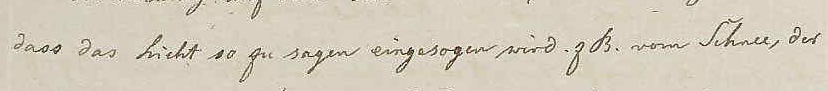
dass das Licht so zu sagen eingesogen wird z. B. vom Schnee, der
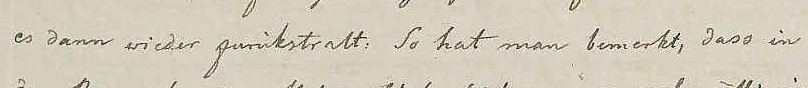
es dann wieder zurükstralt: So hat man bemerkt, dass in
